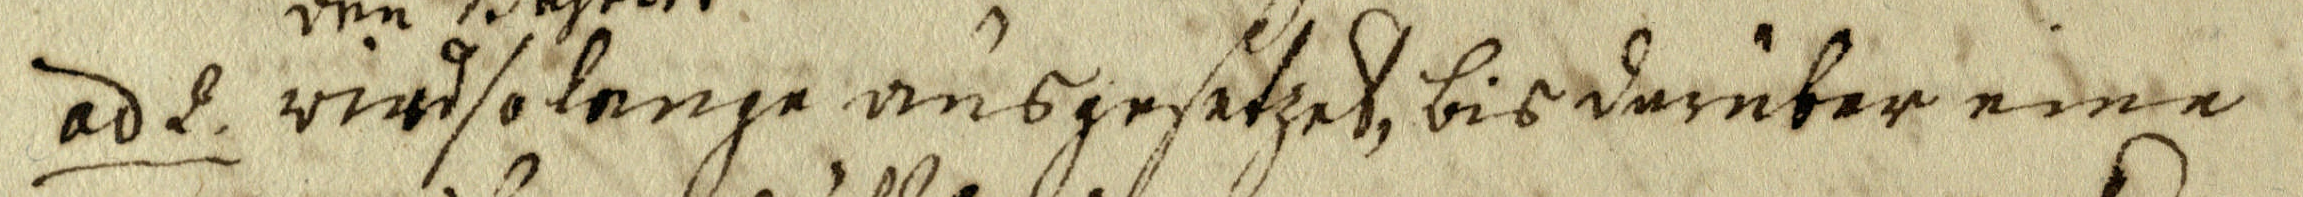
ad 2. wird so lange ausgesetzet, bis darüber eine
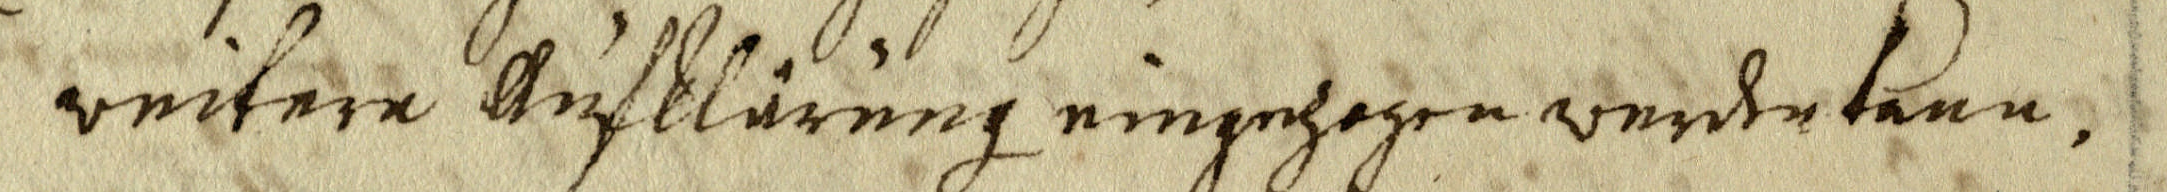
weitere Aufklärung eingezogen werden kann.
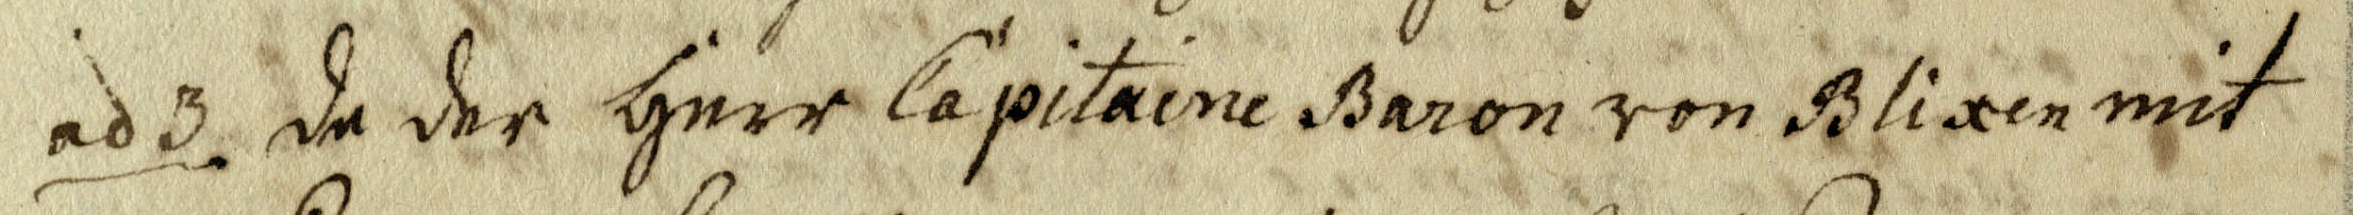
ad 3. Da der Herr Capitaine baron von Blixen mit
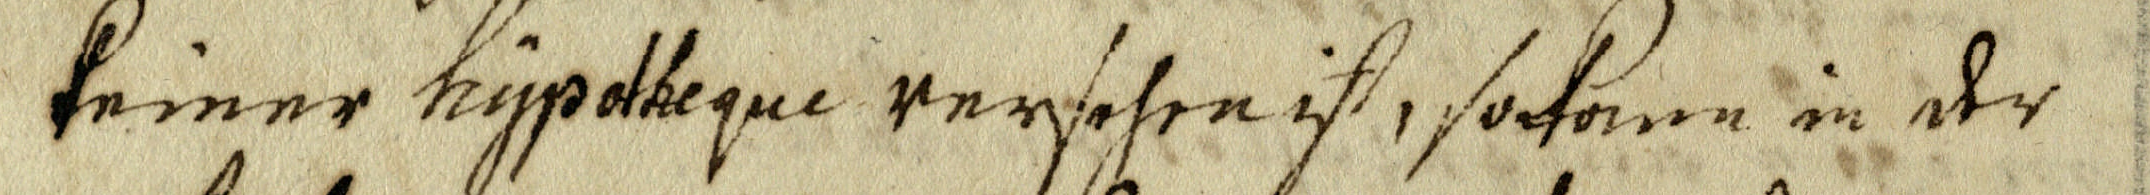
keine hÿpotheque versehen ist, so kann in der
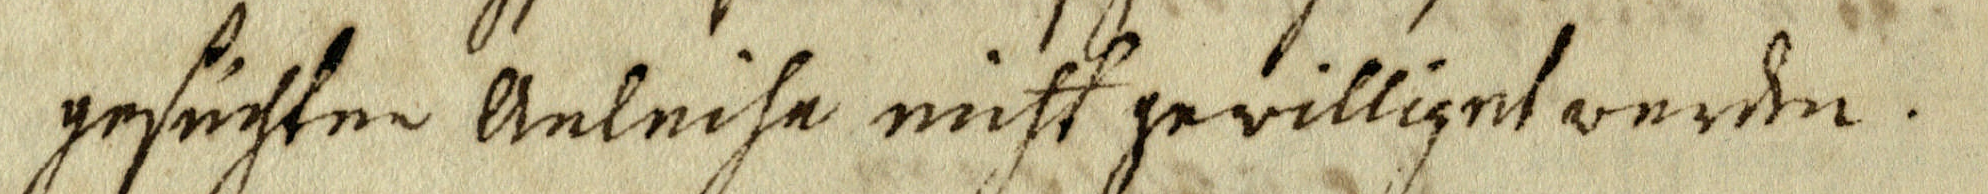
gesuchten Anleihe nicht gewilliget werden.
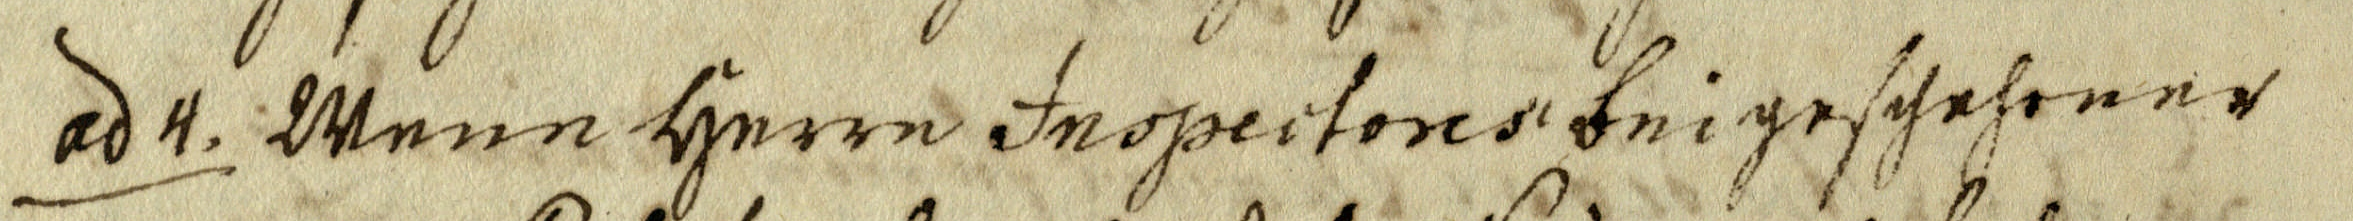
ad 4. Wenn Herrn Inspectores bei geschehener
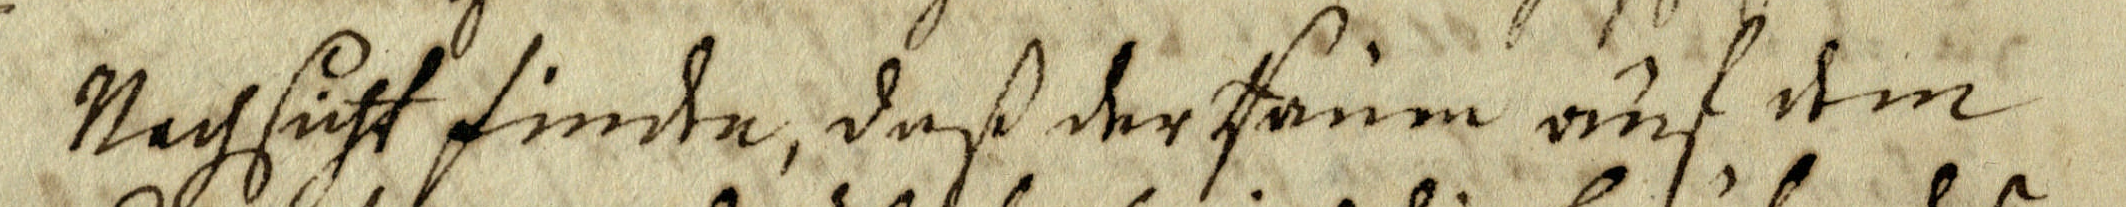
Nachsicht finden, daß der Raum auf dem
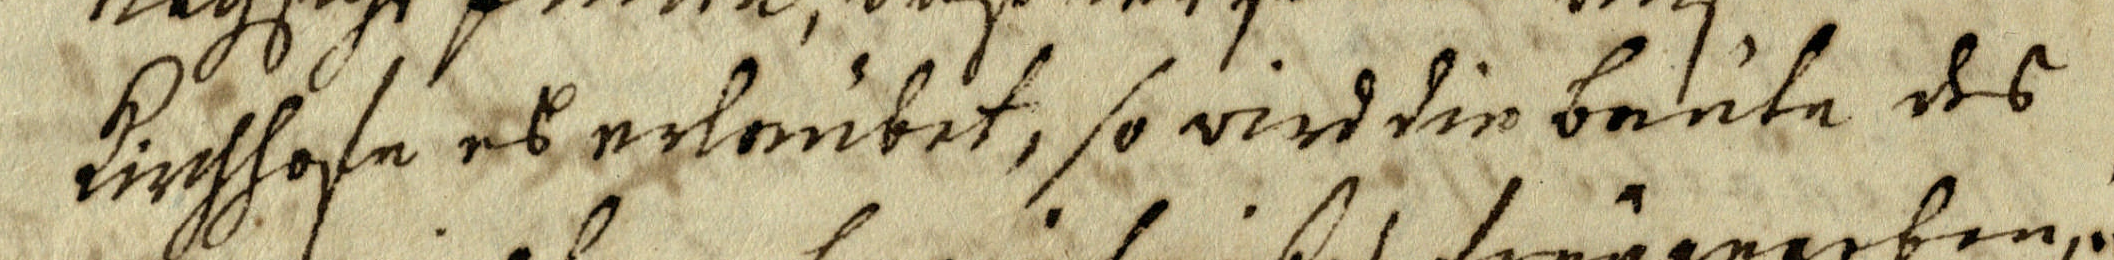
Kirchhofe es erlaubet, so wird die Baute des
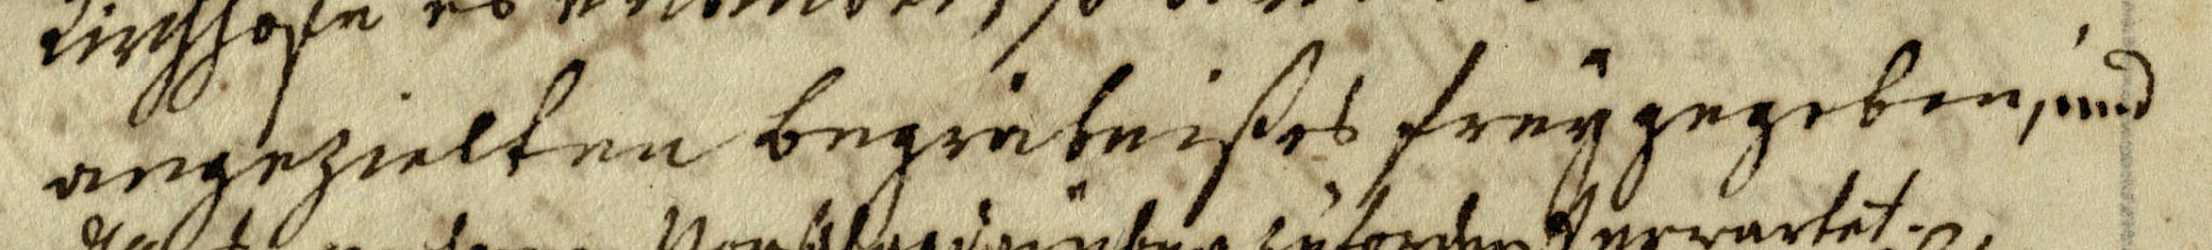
angezielten Begräbnißes freÿgegeben, und
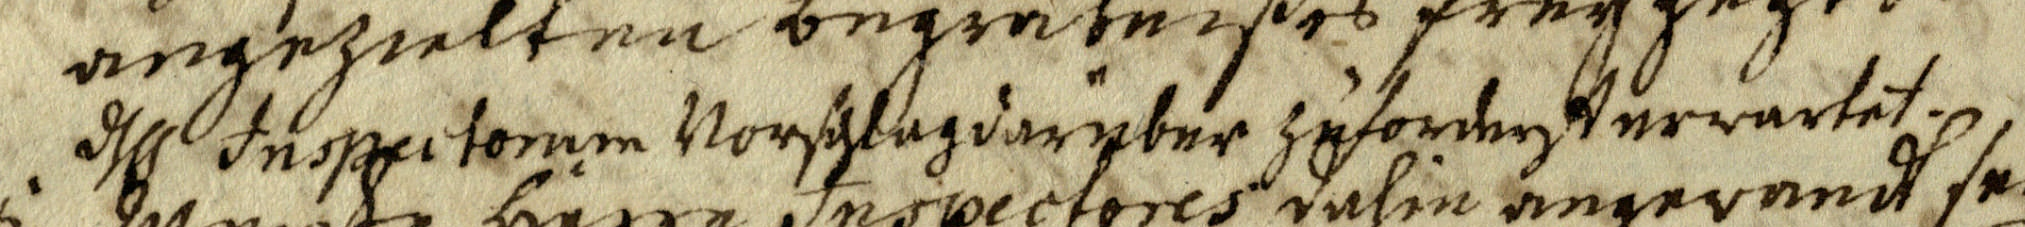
dh Inspectorum Vorschlag darüber zuforderst erwartet.
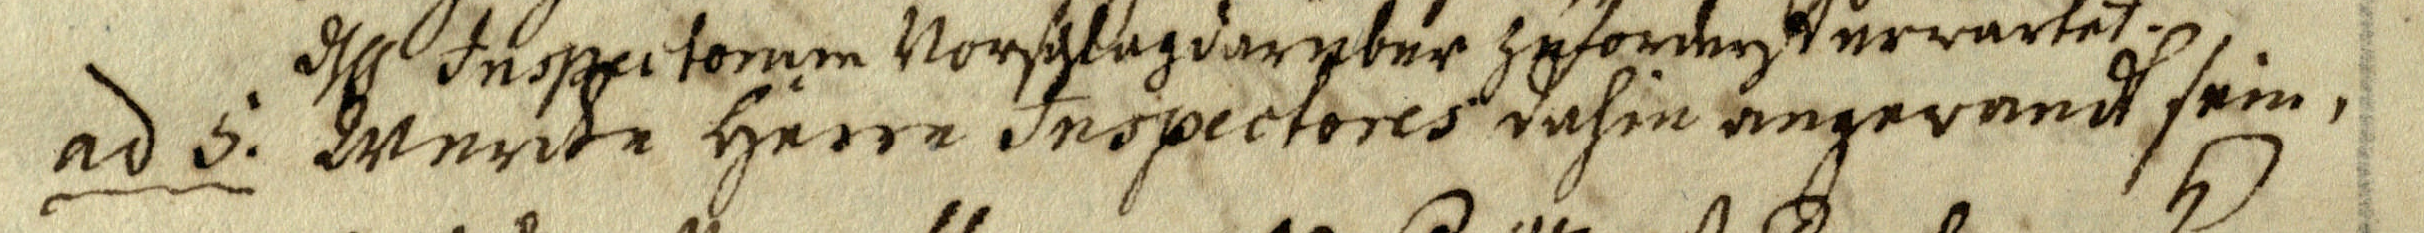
ad 5. Werden Herrn Inspectores dahin angewandt sein,
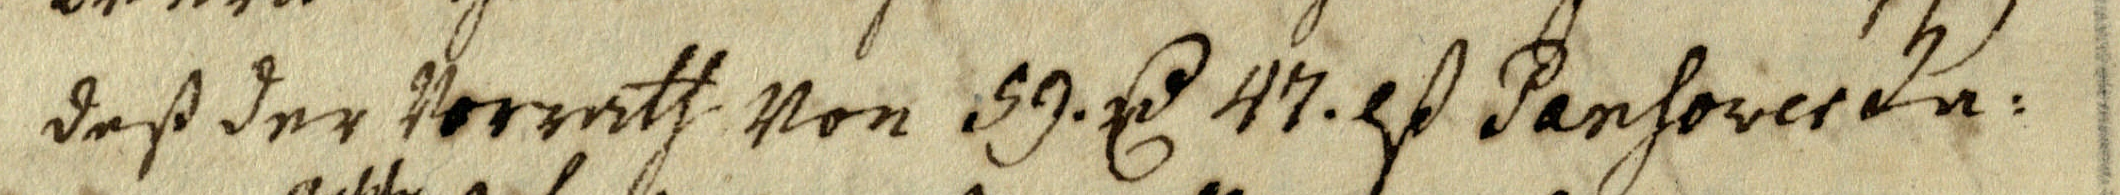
daß der Vorrath von 59. rt 47. s Pansower Ka¬
